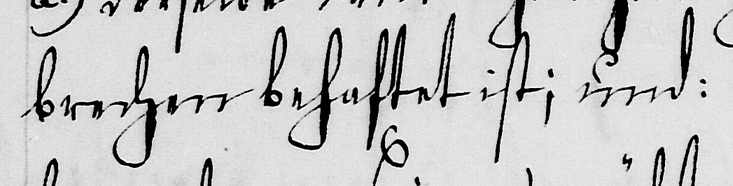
brechen behaftet ist; und:
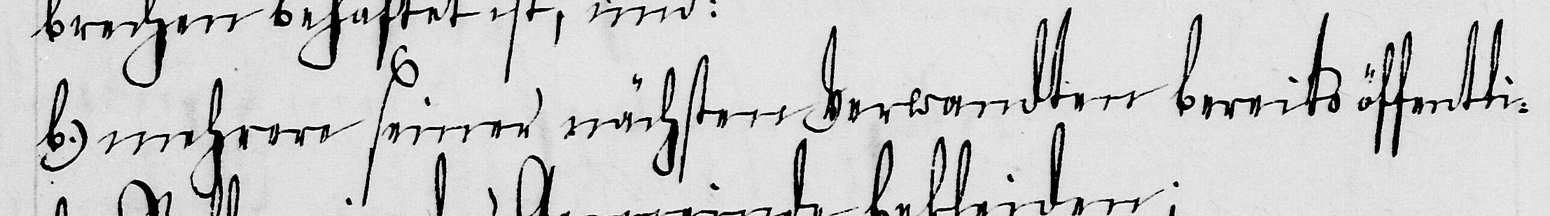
b.) mehrere seiner nächsten Verwandten bereits öffentli¬
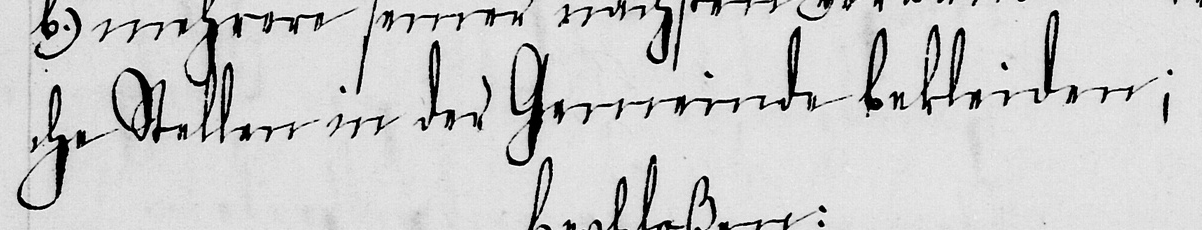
che Stellen in der Gemeinde bekleiden;
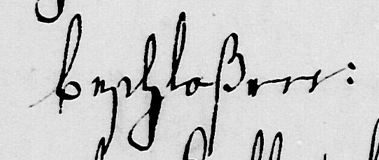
beschloßen:
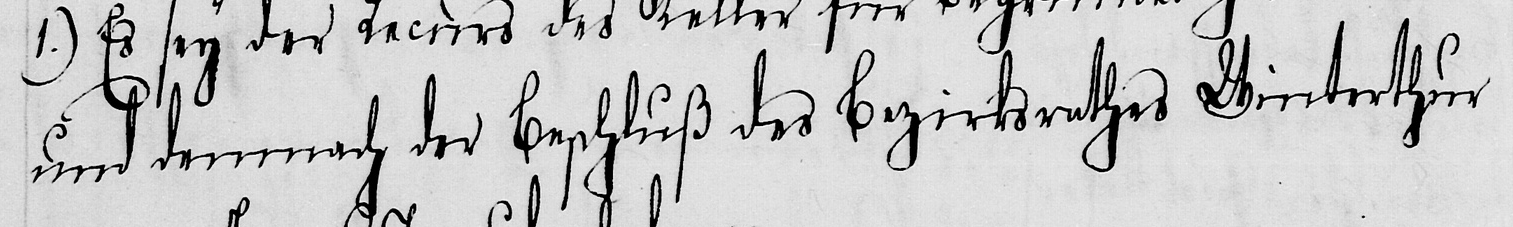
und demnach der Beschluß des Bezirksrathes Winterthur
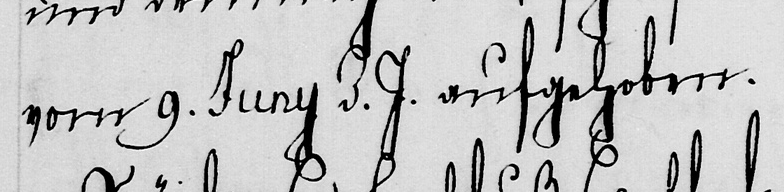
vom 9. Juny d. J. aufgehoben.
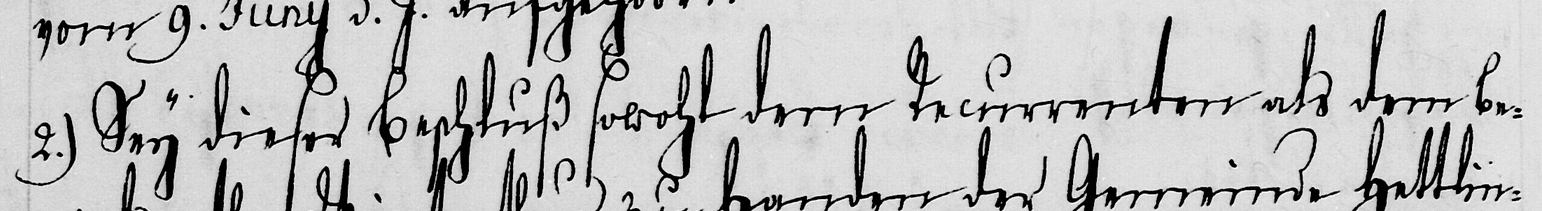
2.) Sey dieser Beschluß sowohl dem Recurrenten als dem Be¬
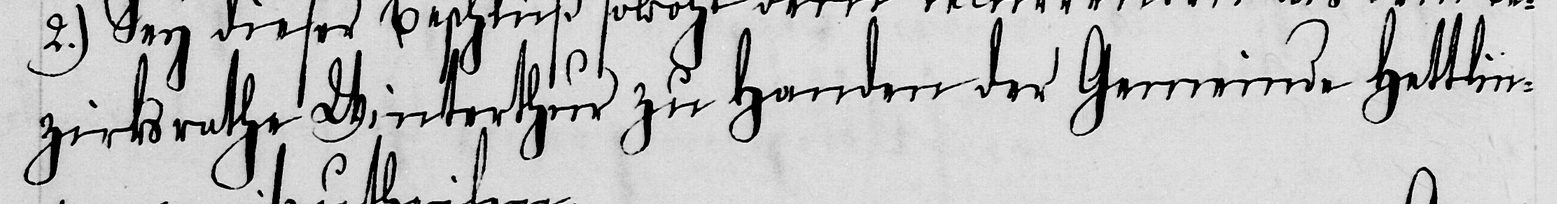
zirksrathe Winterthur zu Handen der Gemeinde Hettli¬
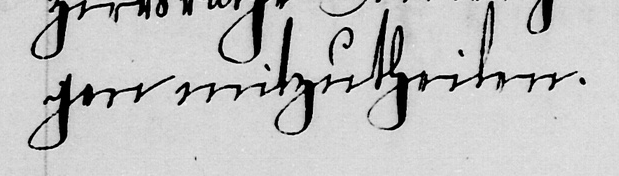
ngen mitzutheilen.
